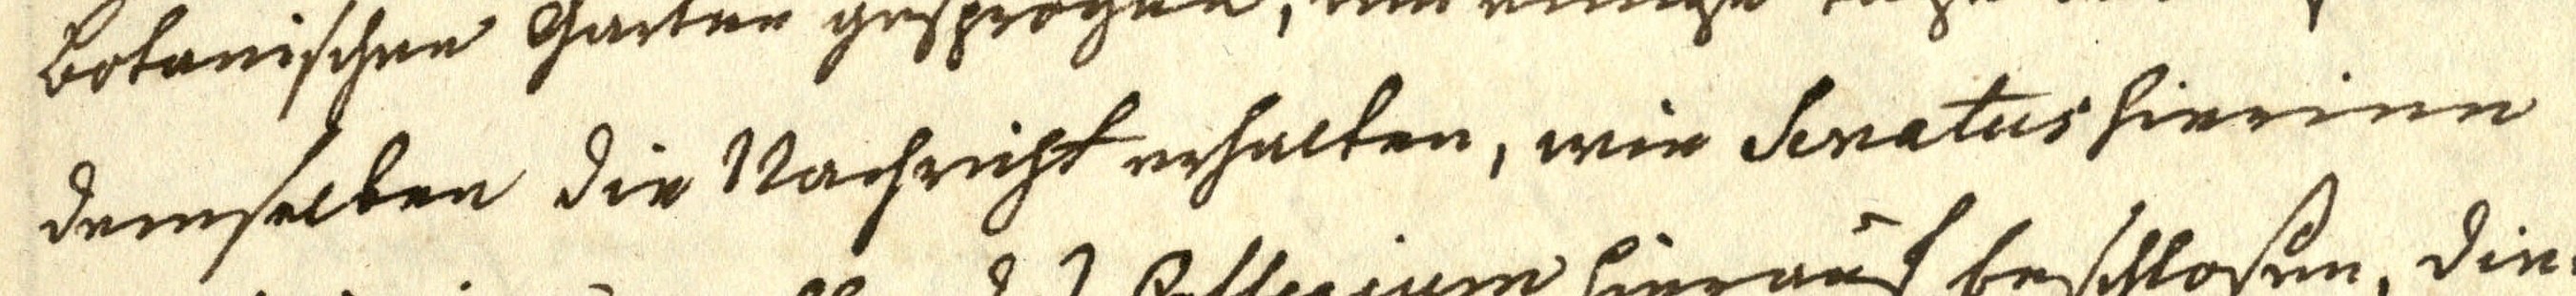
demselben die Nachricht erhalten, wie Senatus hierinn
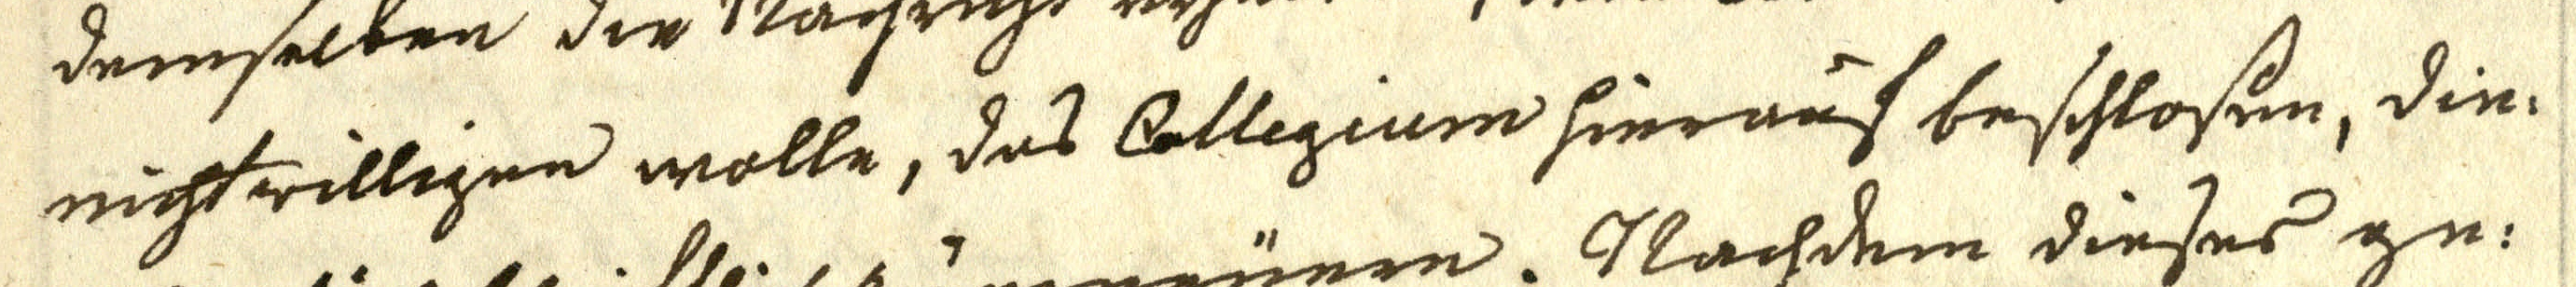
nicht willigen wolle, das Collegium hierauf beschloßen, die¬
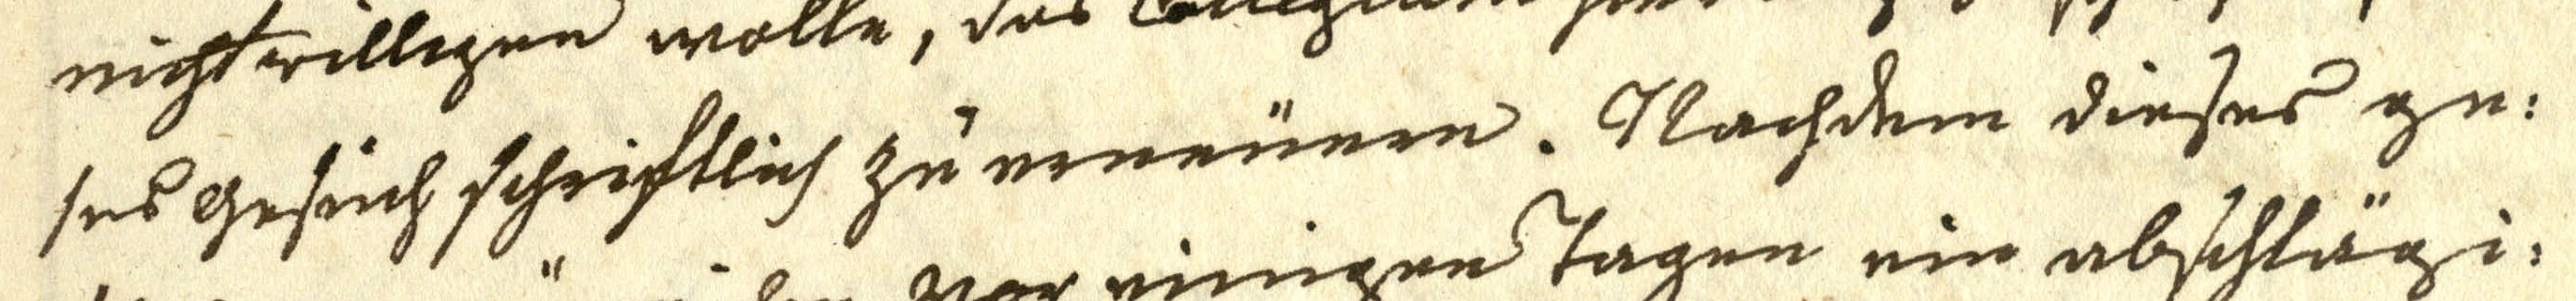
ses Gesuch schriftlich zu erneuern. Nachdem dieses ge¬
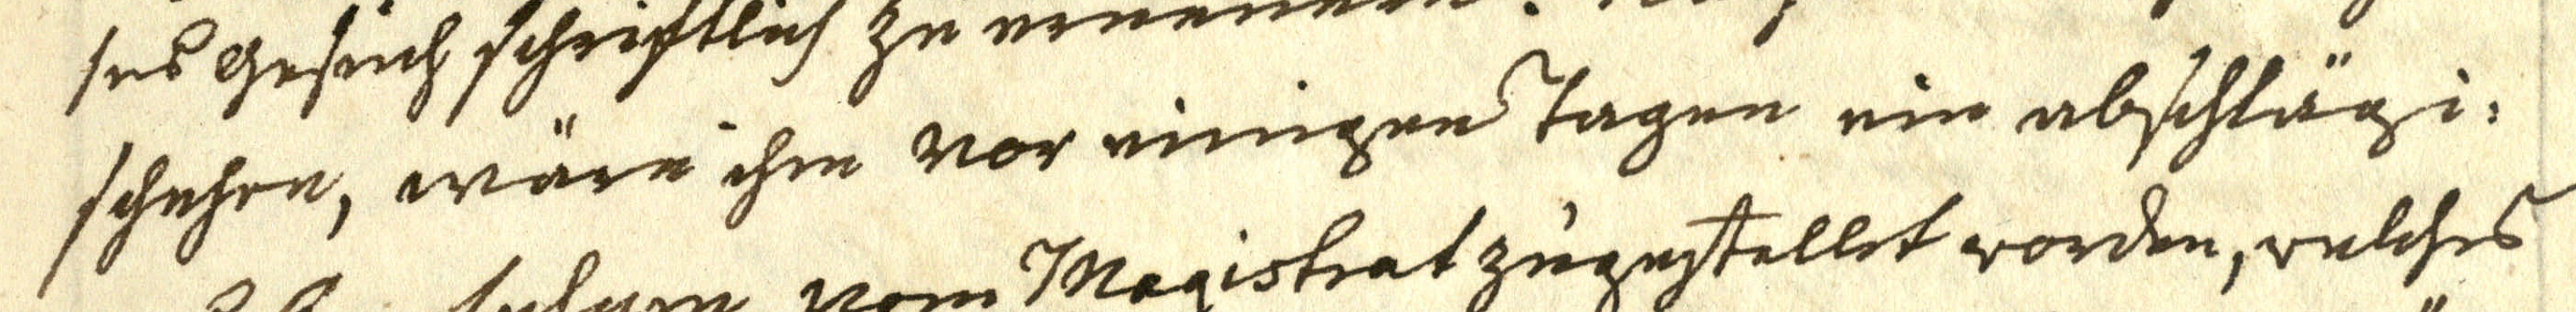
schehen, wäre ihm vor einigen Tagen ein abschlägi¬
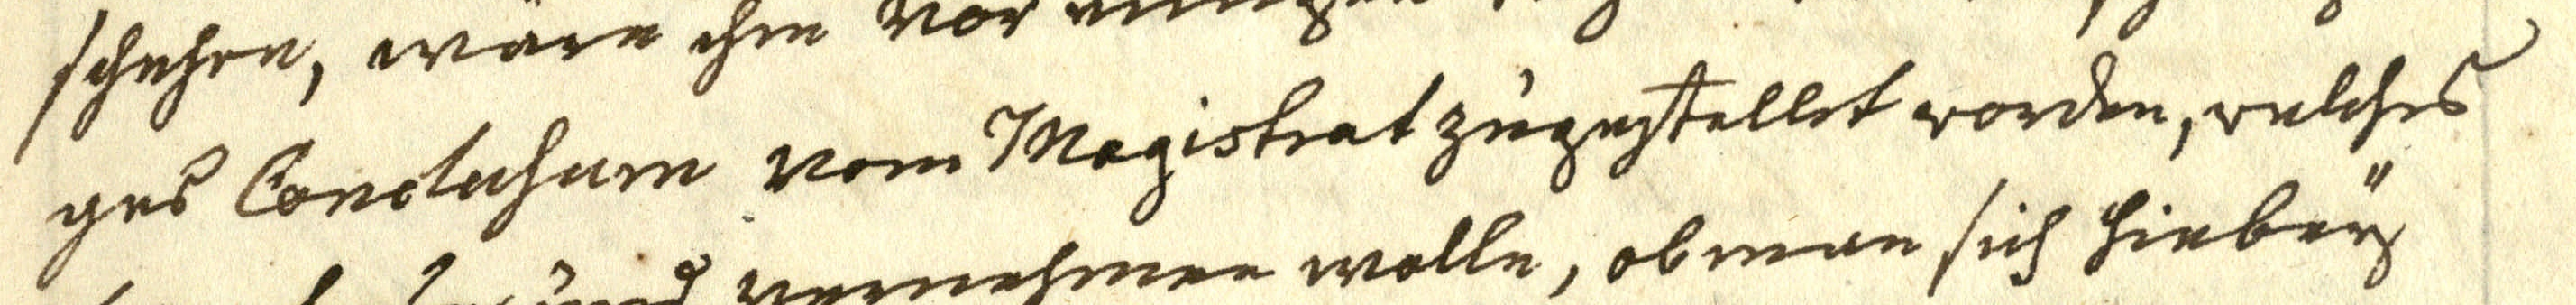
ges Conclusum vom Magistrat zugestellet worden, welches
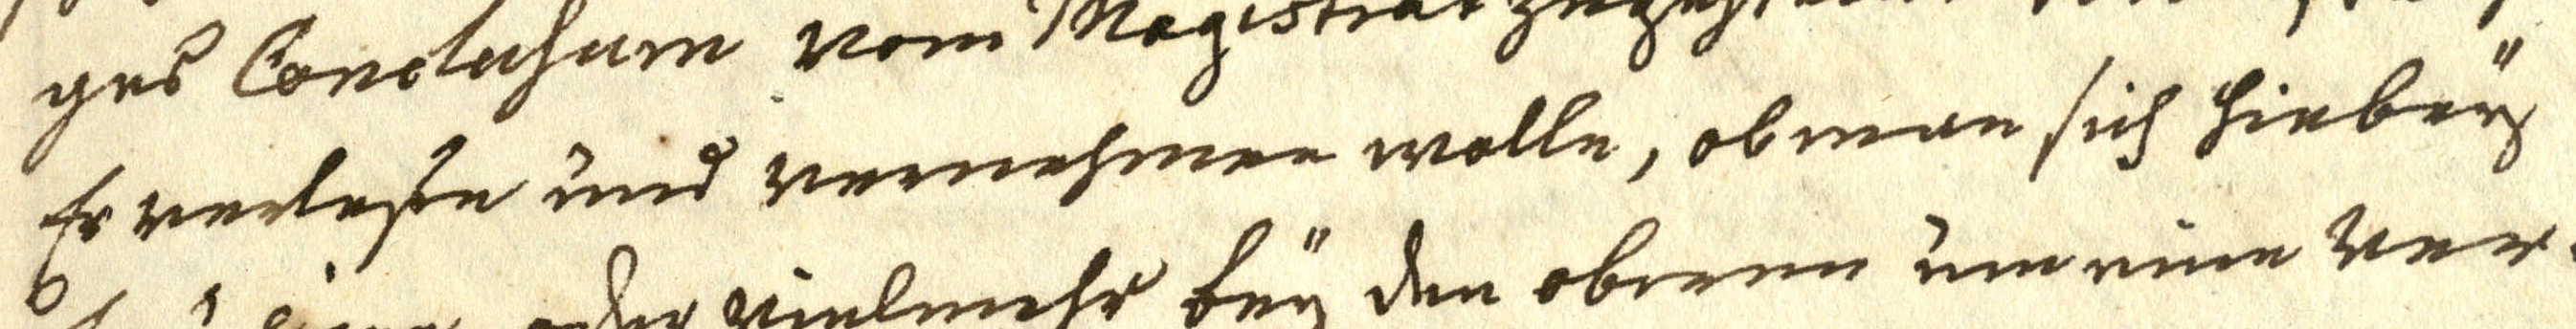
Er verlesen und vernehmen wolle, ob man sich hiebeÿ
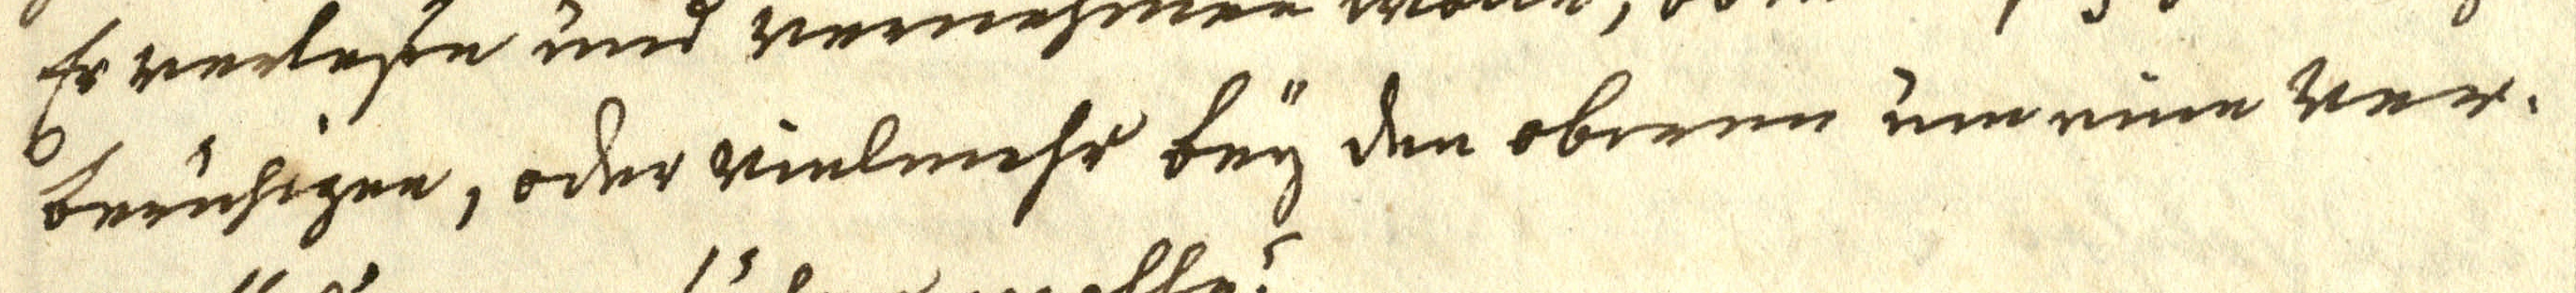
beruhigen, oder vielmehr beÿ den oberen um neue Ver¬
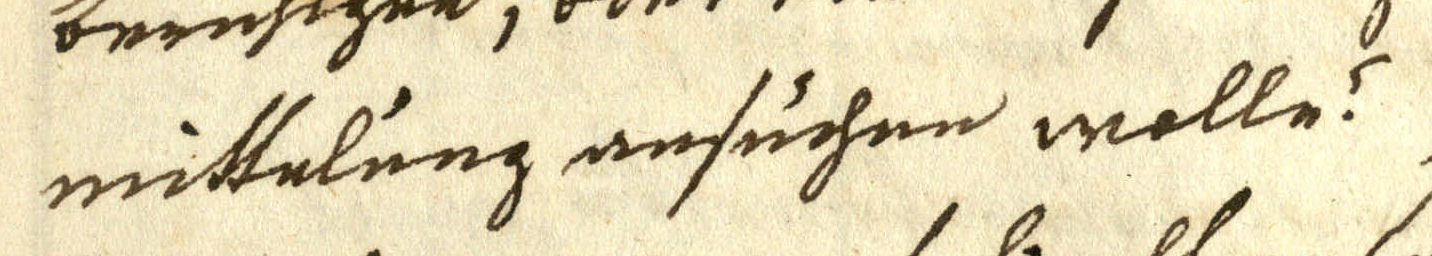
mittelung ansuchen wolle?
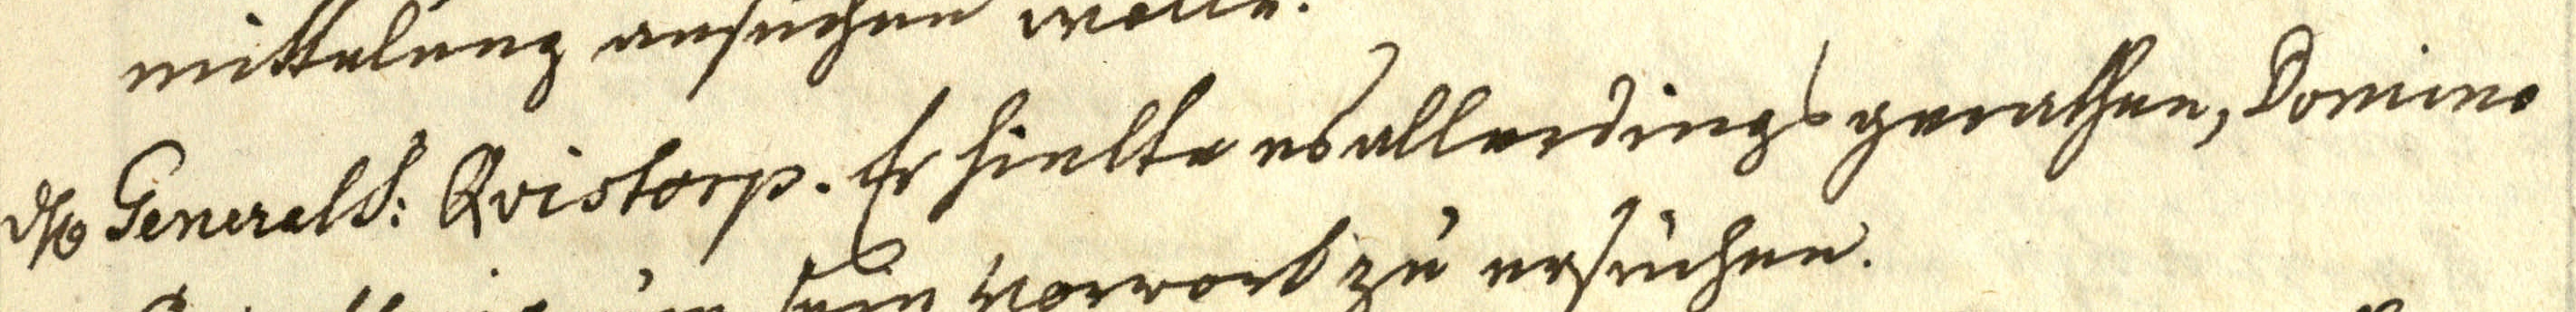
dh. GeneralS. Quistorp. Er hielte es allerdings gerathen, Domino
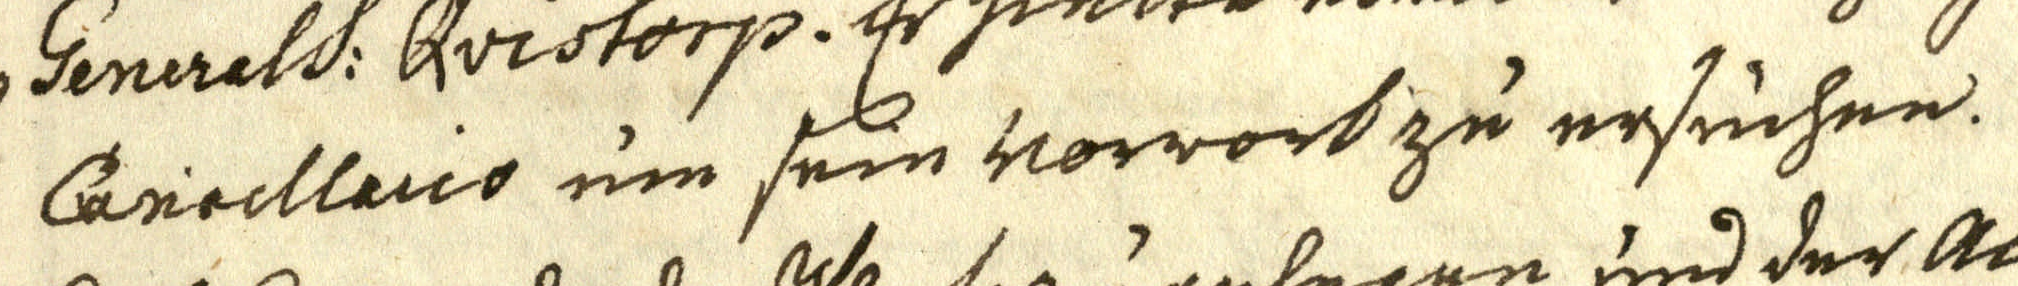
Cancellario ein sein Vorwort zu ersuchen.
